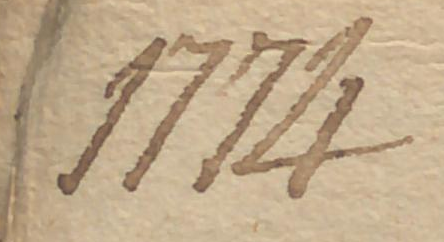1774
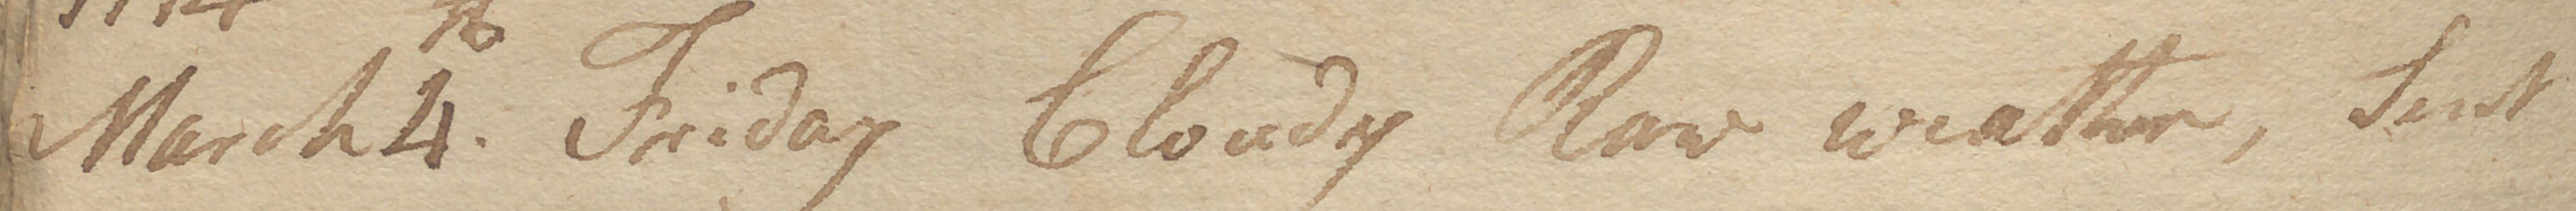March 4^th. Friday Cloudy Raw weather, Sent
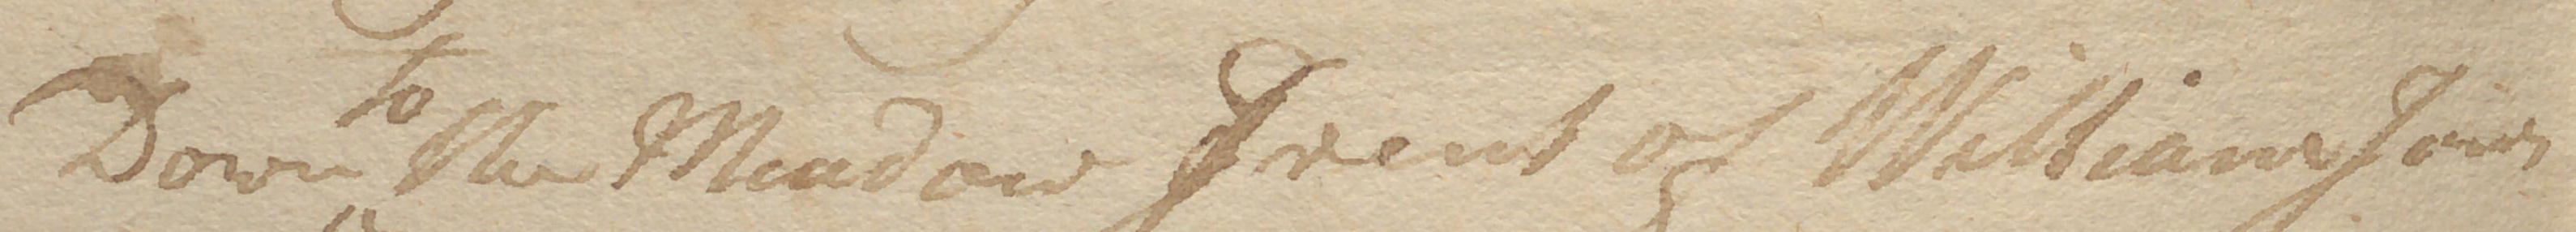Down ^to the Meadow I rent of Williams I own
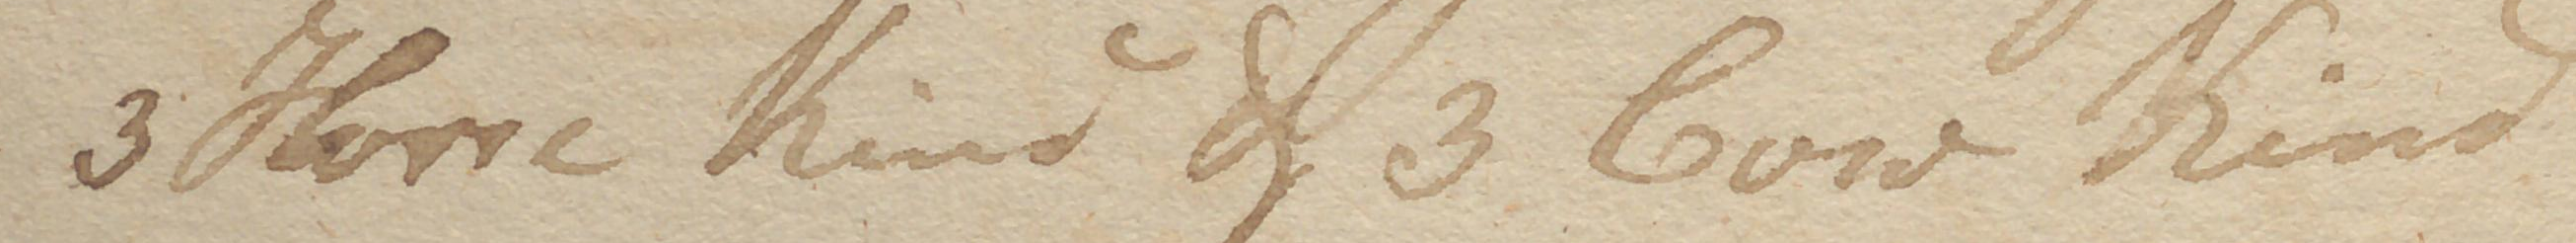3 Horse Kind & 3 Cow Kind
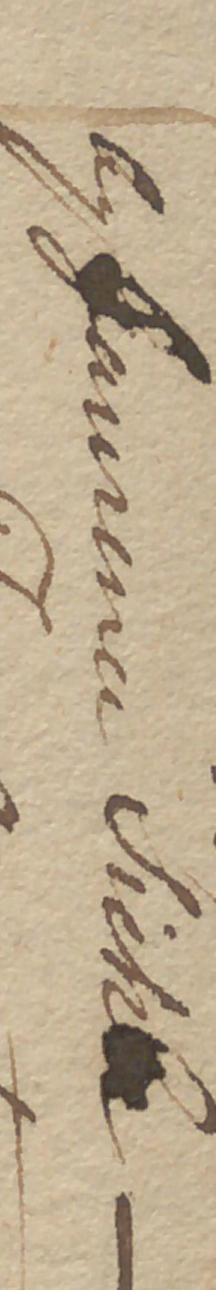by Lawrence Sickle
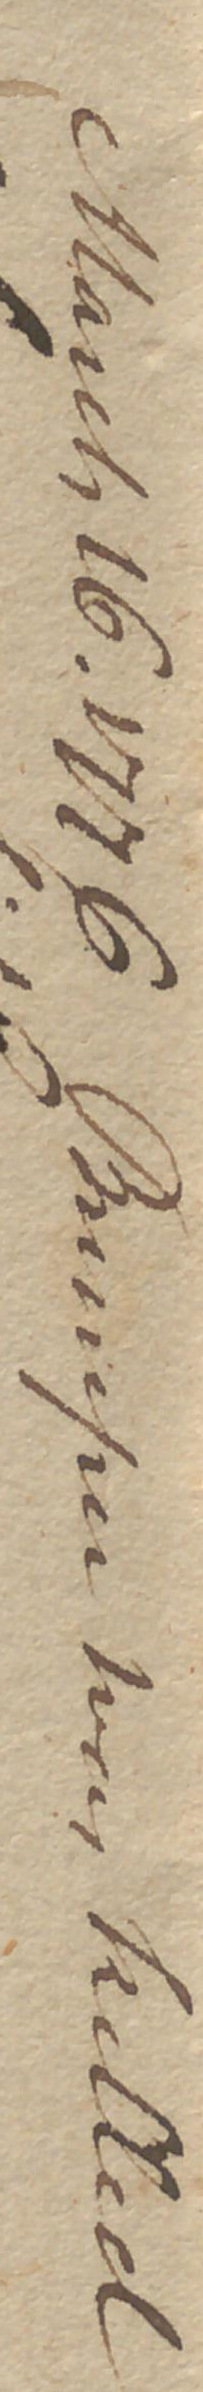Marchs 16. 1776 Bumper was killed
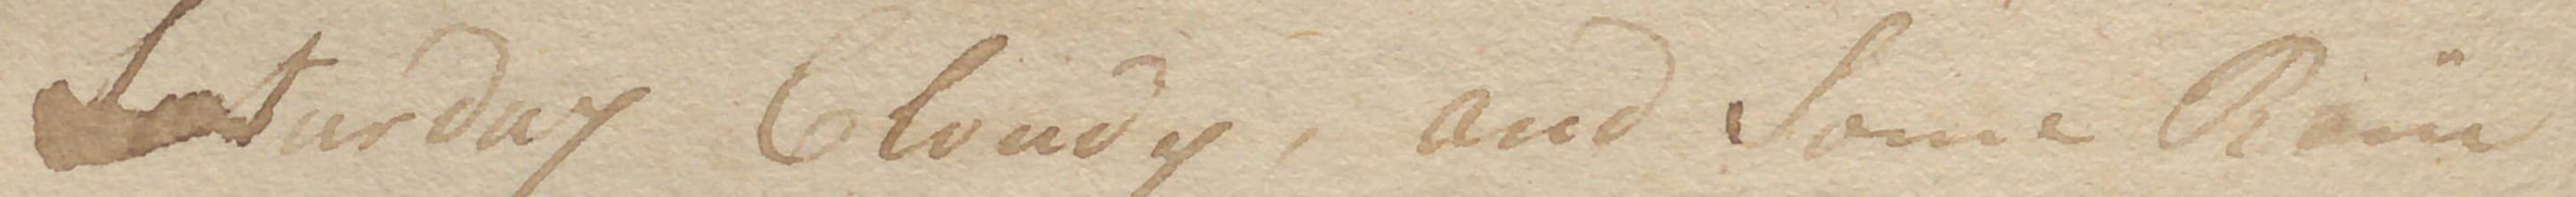Saturday Cloudy, and some Rain
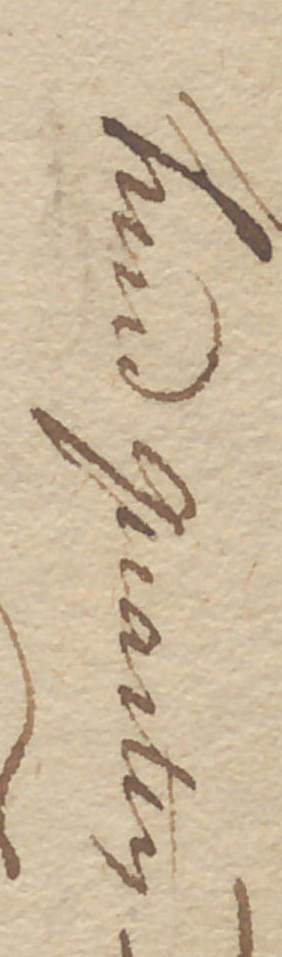hind quarters
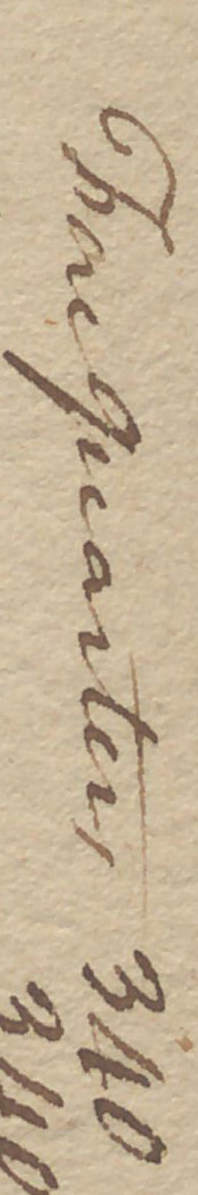Fore quarters 340
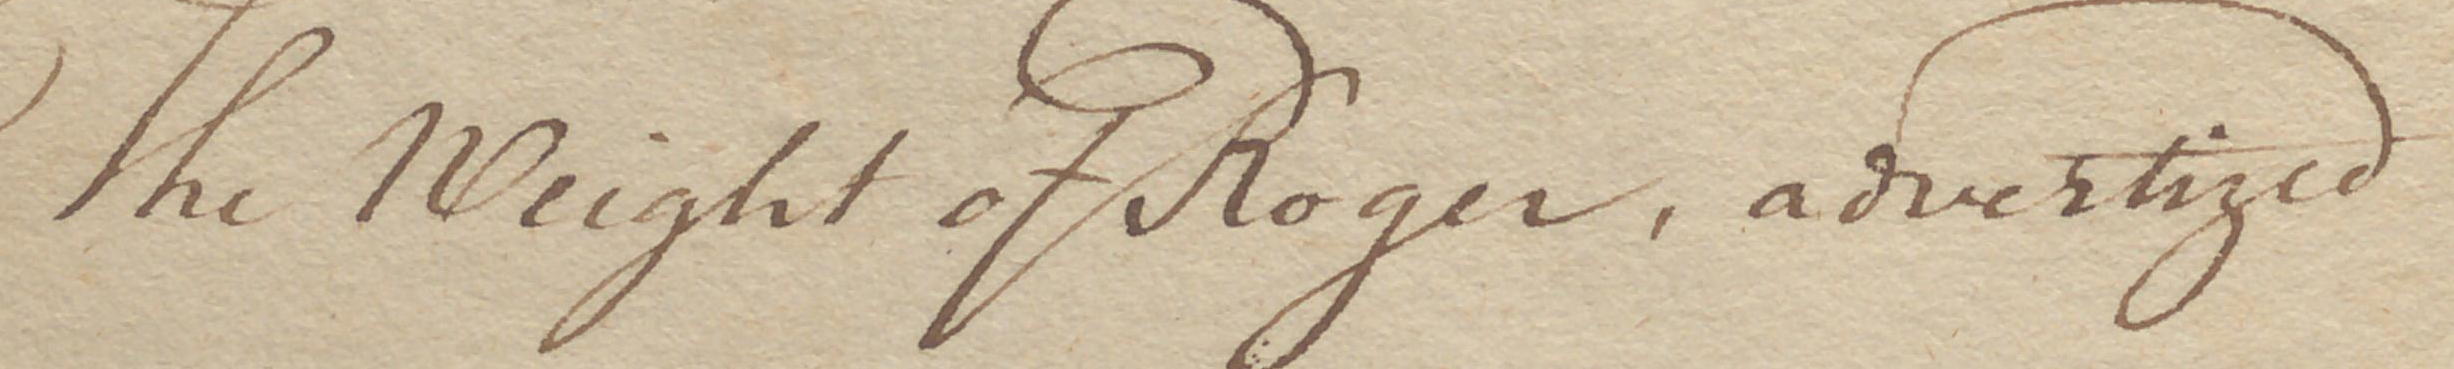the Weight of Roger, advertized
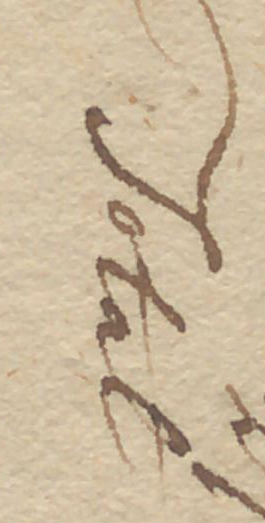Total
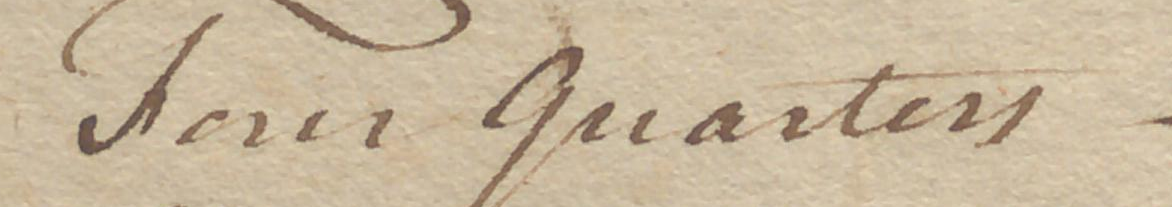Fore quarters
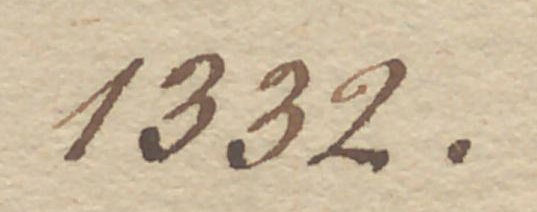1332.
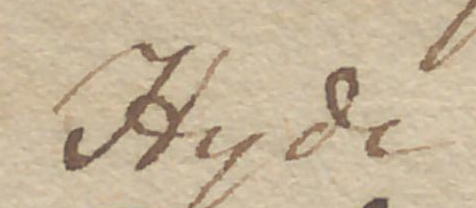Hyde
